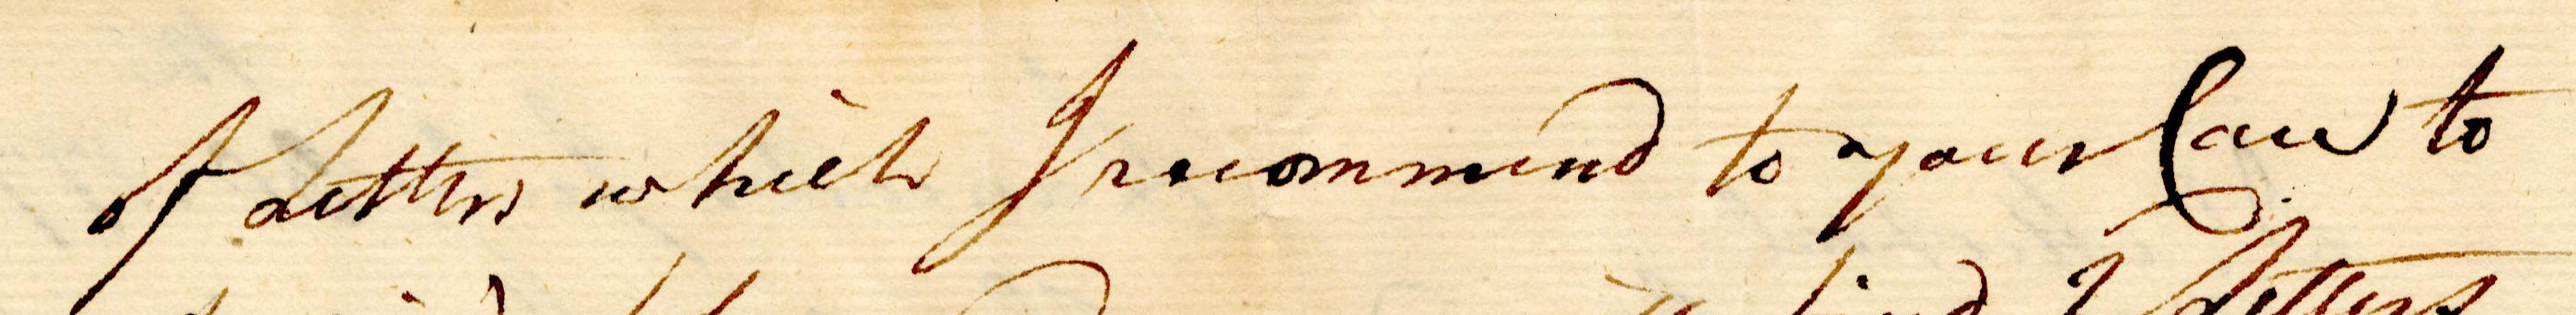of Letters which I recommend to your Care to
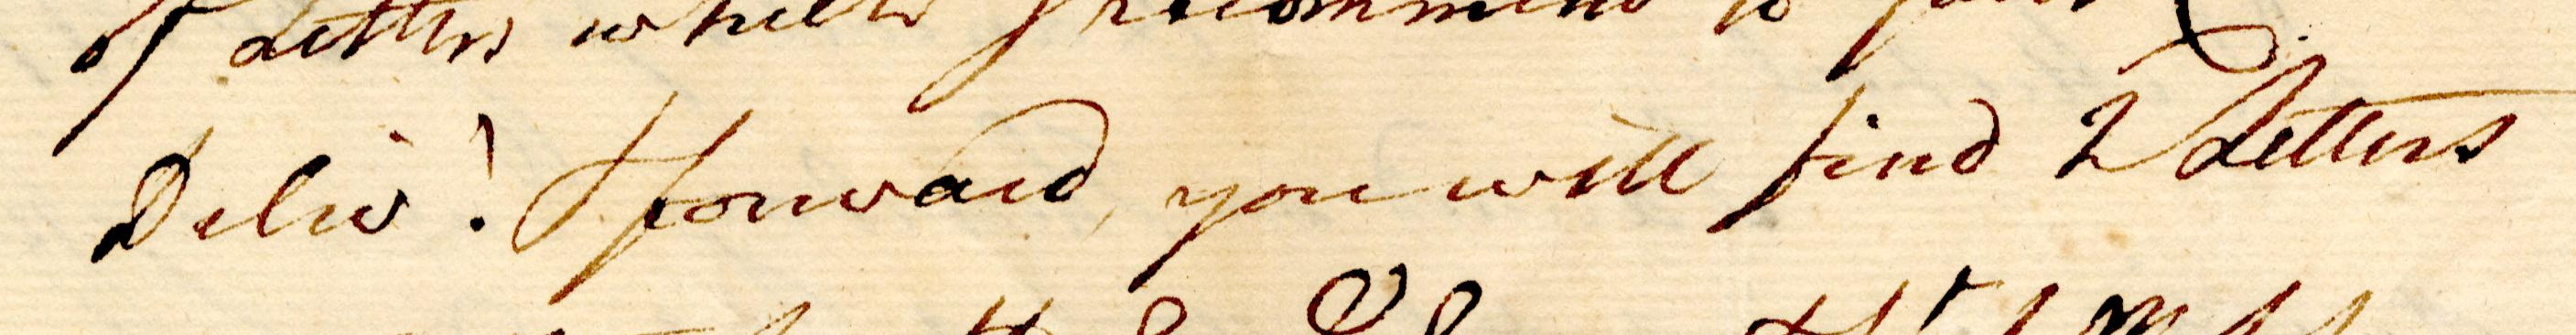Deliv^r. & forward, you will find 2 Letters
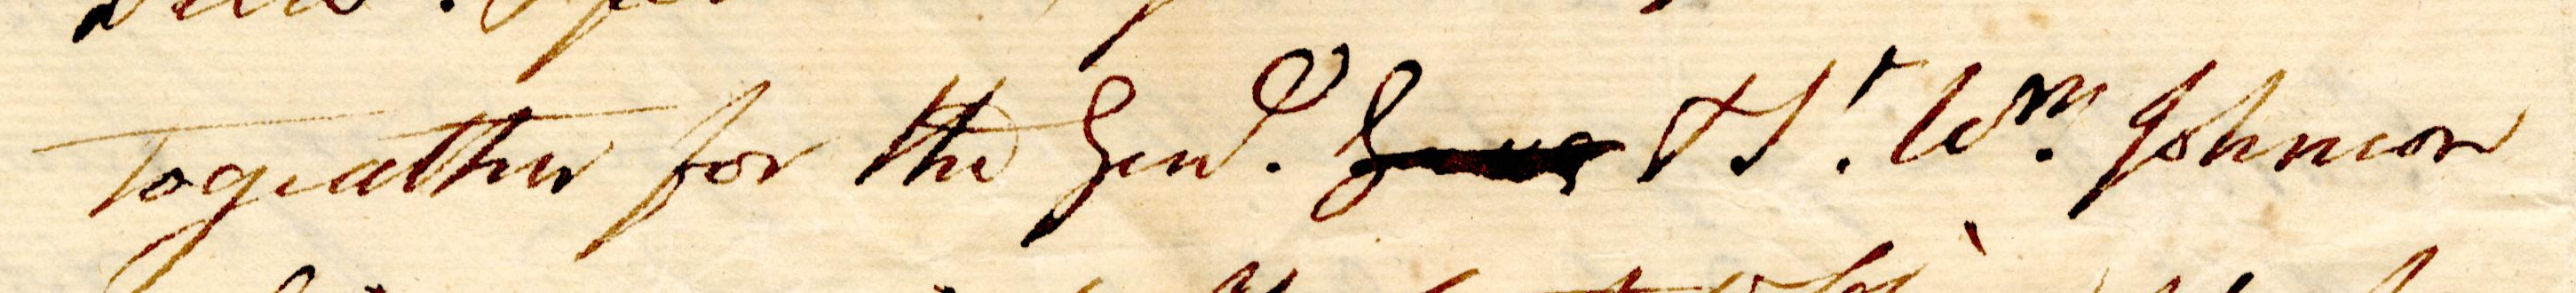Togather for the Gen^l. [___] & 1^st. Co^nl Johnson
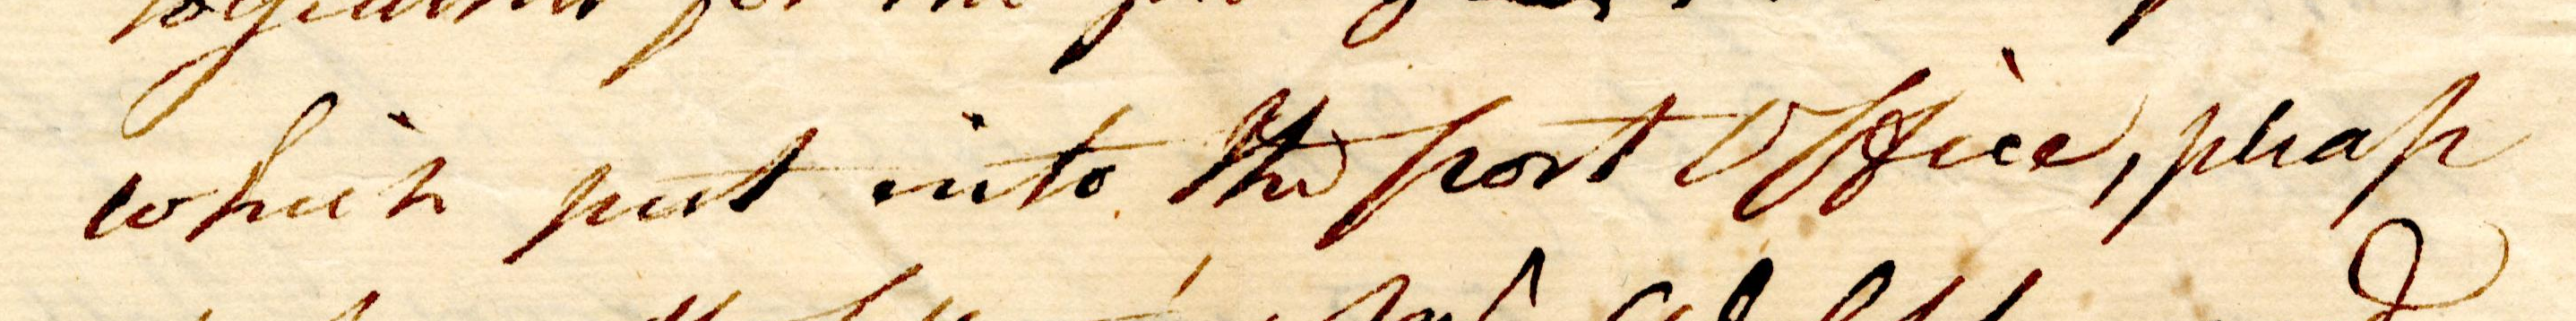which put into the post office, please
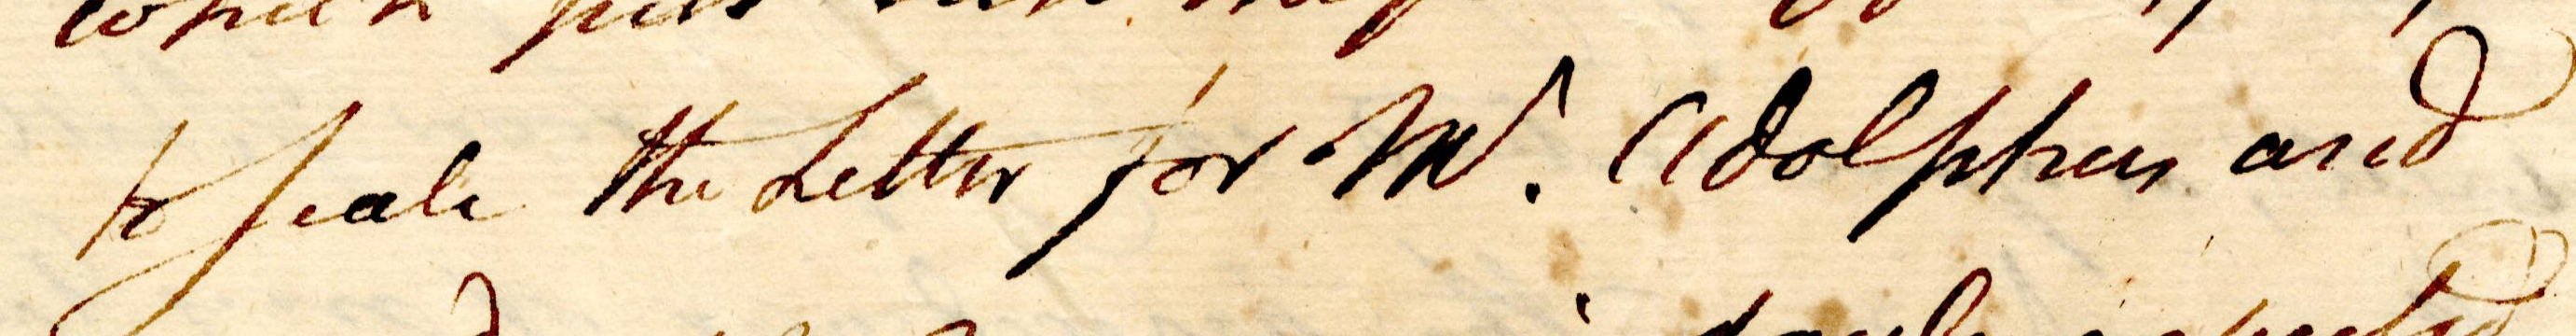to seale the Letter for M^r. Adolphus and
